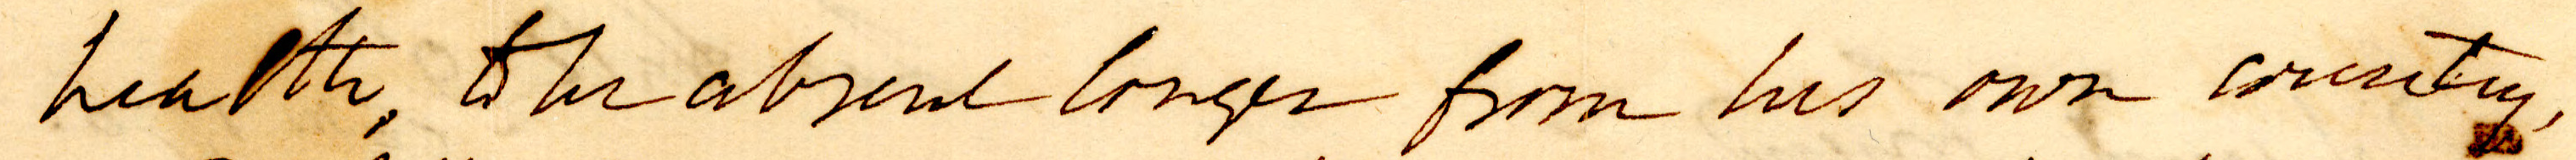health, to be absent longer from his own country,
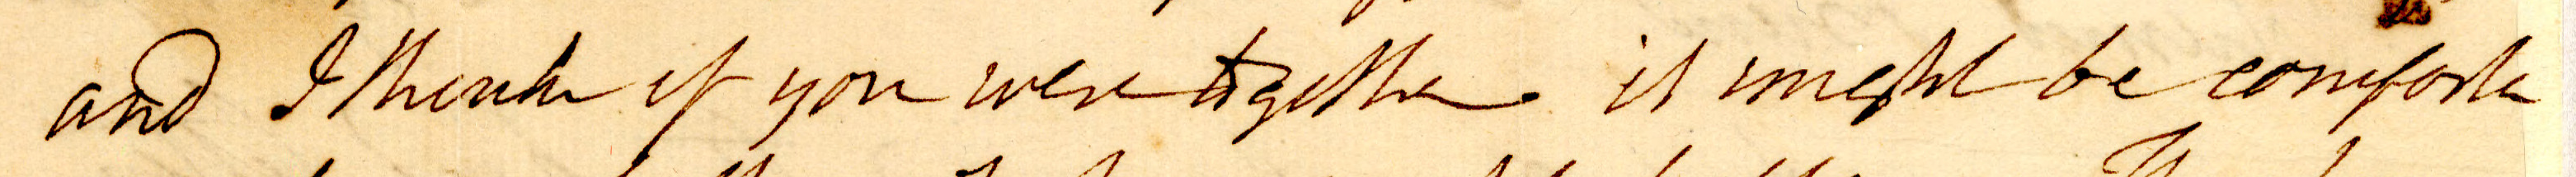and I think if you were together it might be comforta
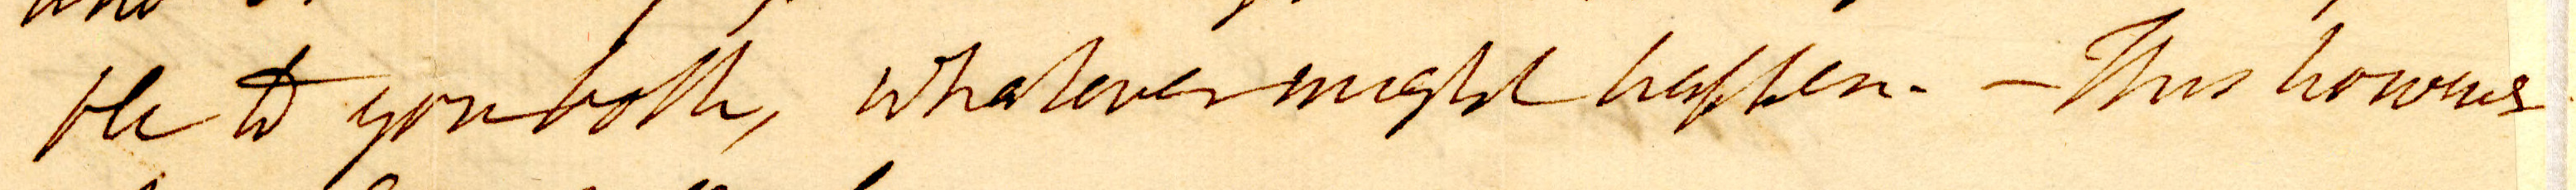ble to you both, whatever might happen.- This however
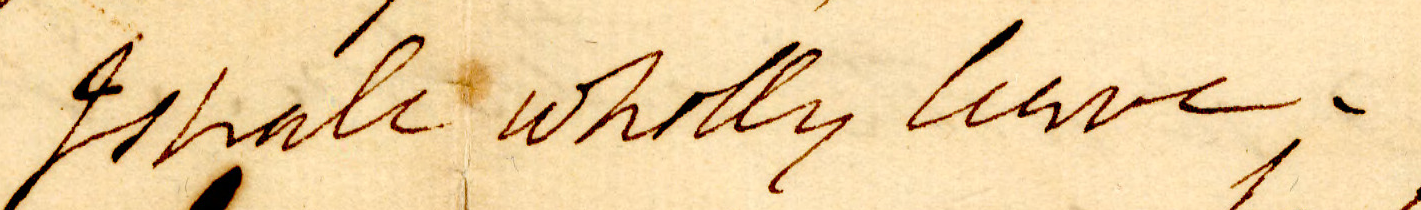I shall wholly leave.
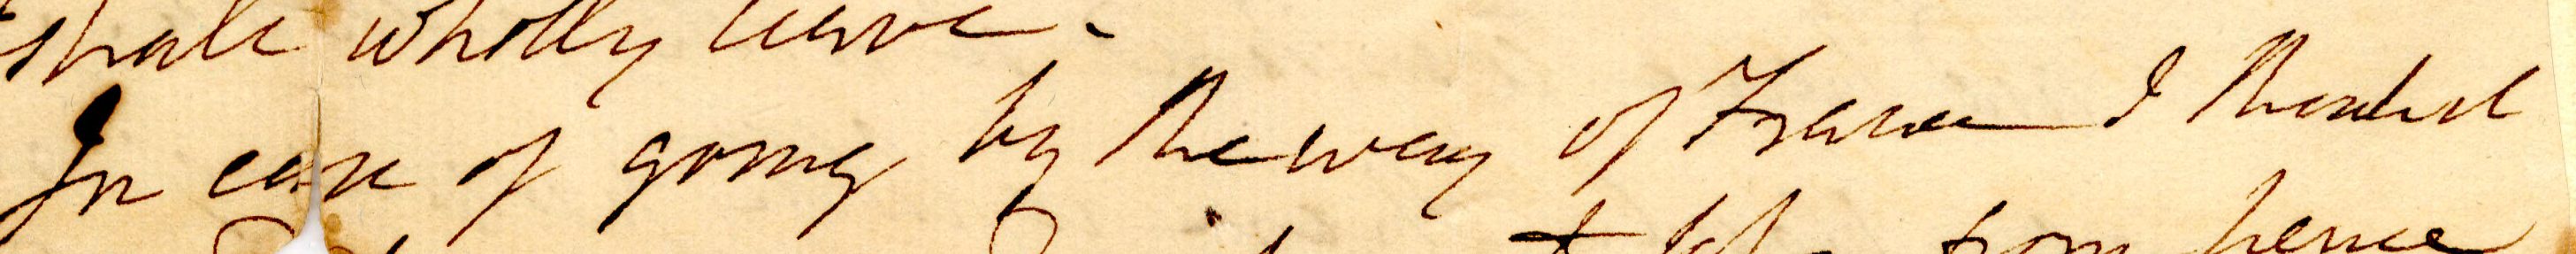In case of going by the way of France I think it
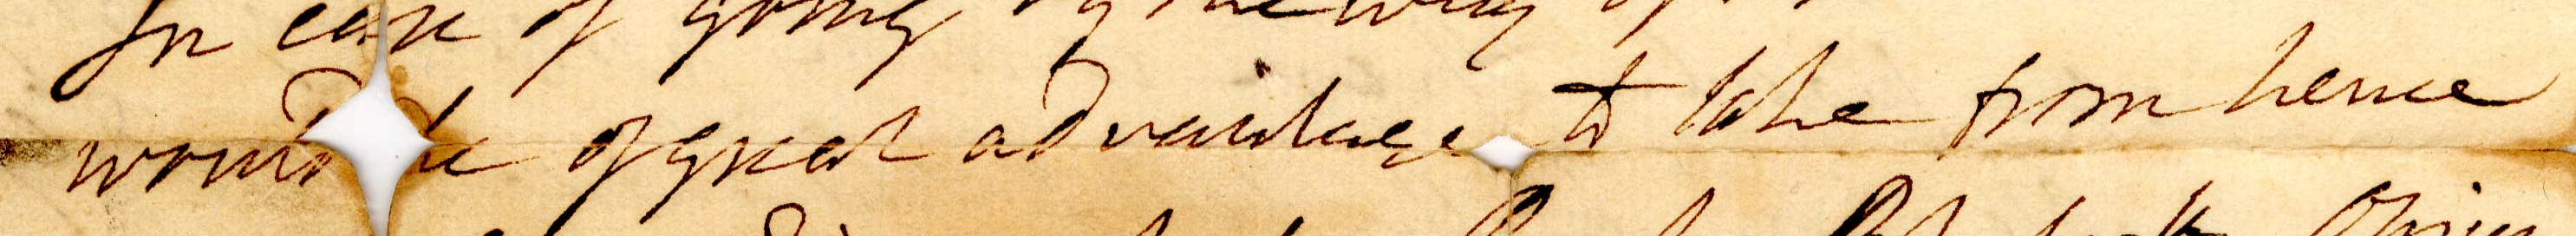would be of great advantage to take from hence
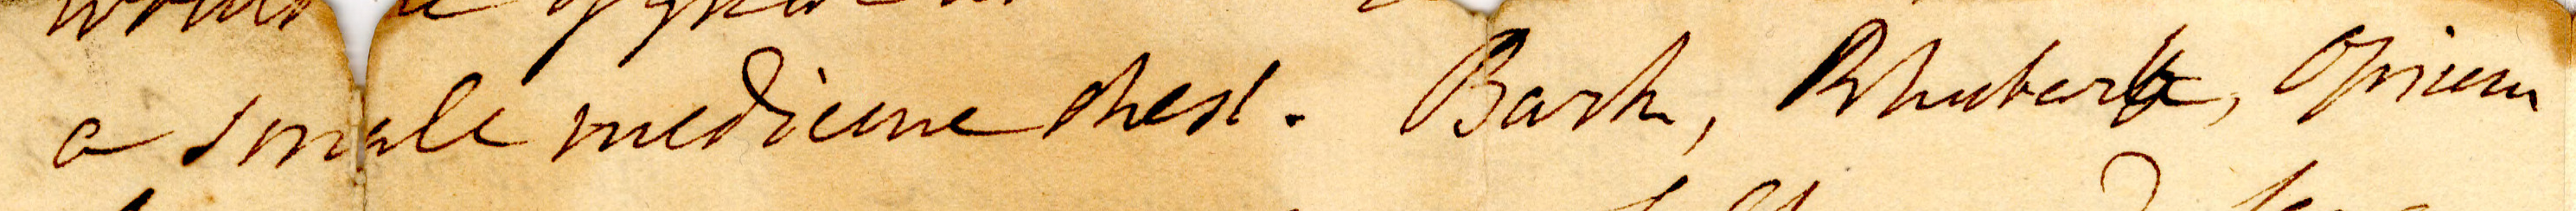a small medicine chest. Bark, Rhubarb, Opium
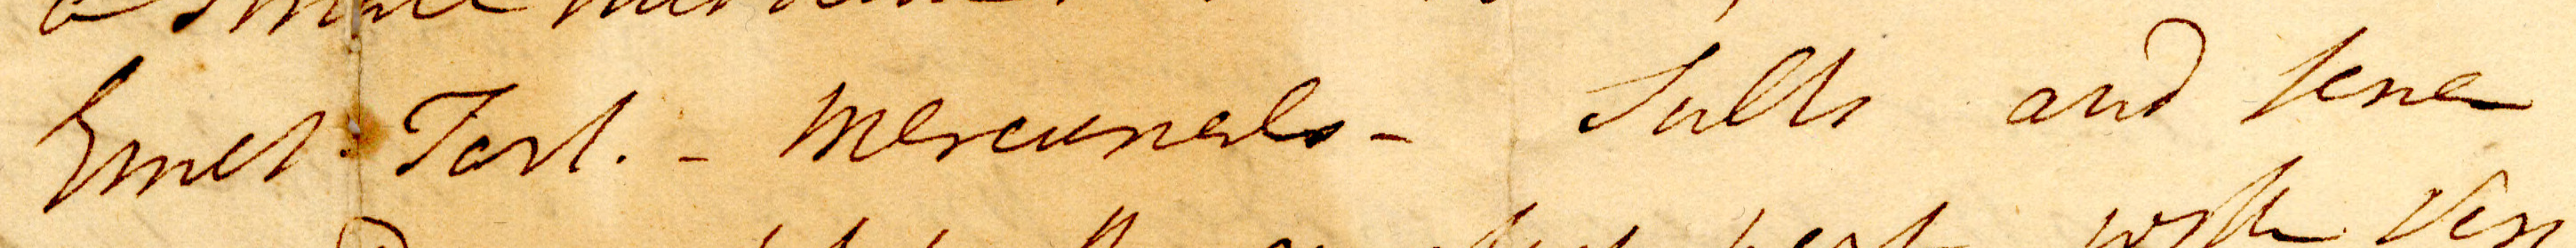Emet: Tart.- mercurials- salts and sena
